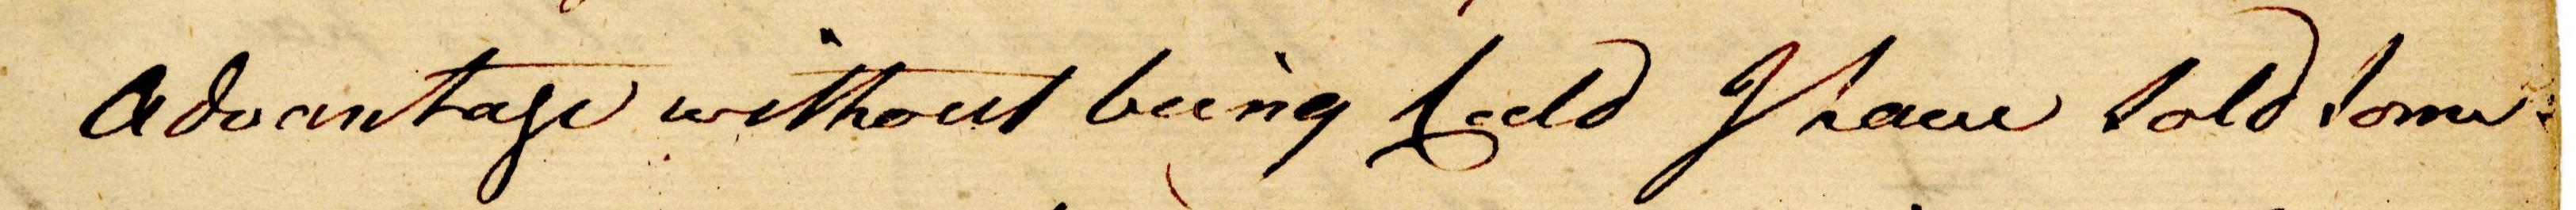Advantage without being foold I have sold some
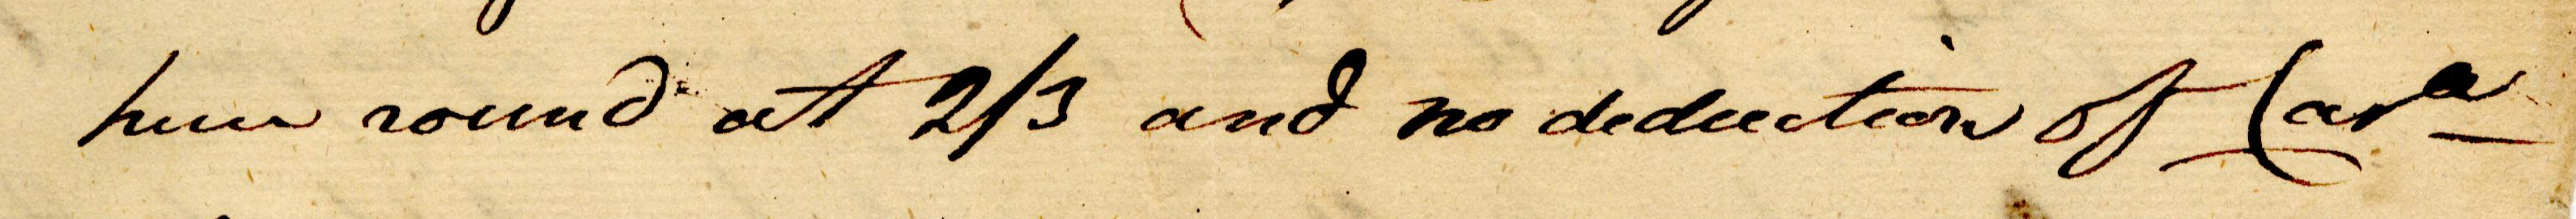here round at 2s3 and no deduction off Car^a
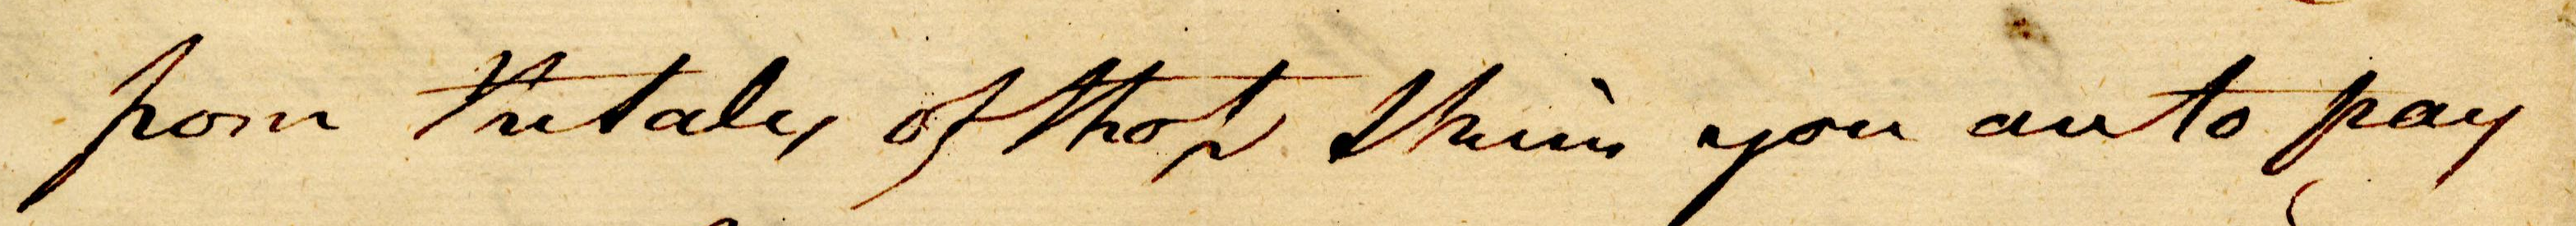from the sales of those skins you are to pay
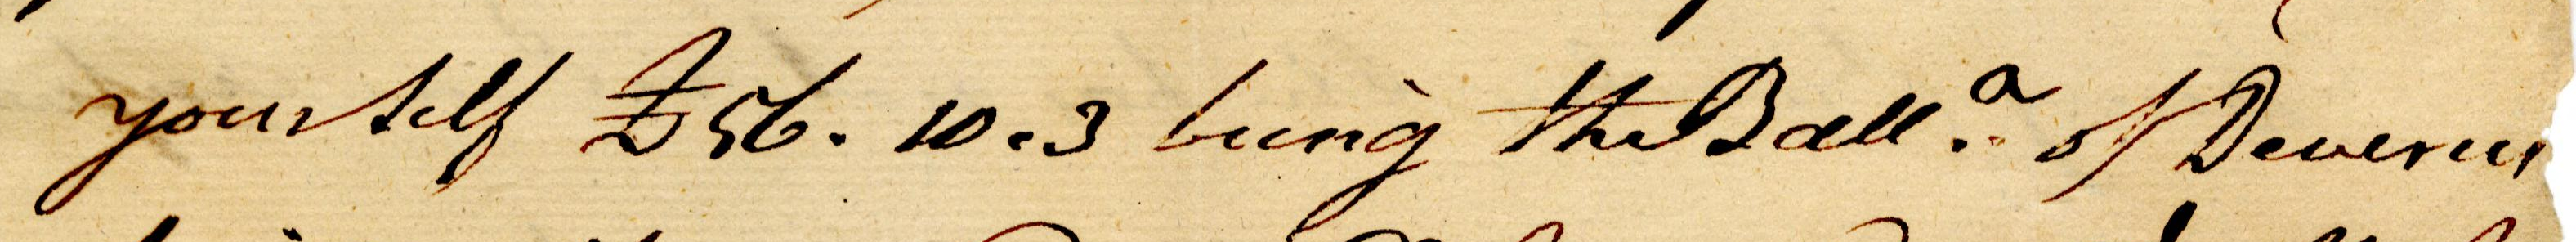your self £56.10.3 being the Ball^ce. of Deliveries
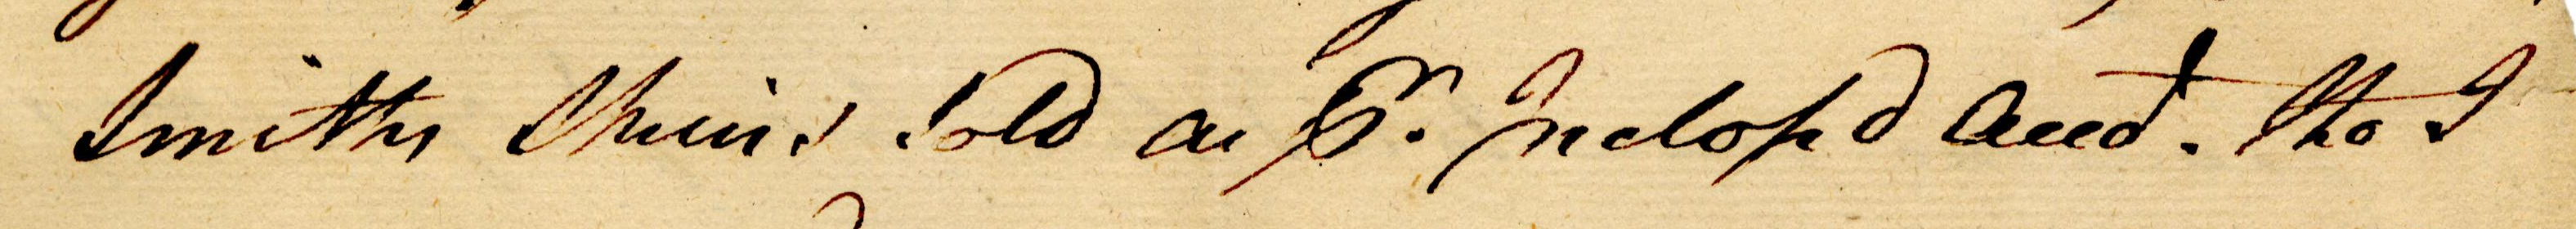Smiths skins sold as C^r. Inclosed Acco^t. tho I
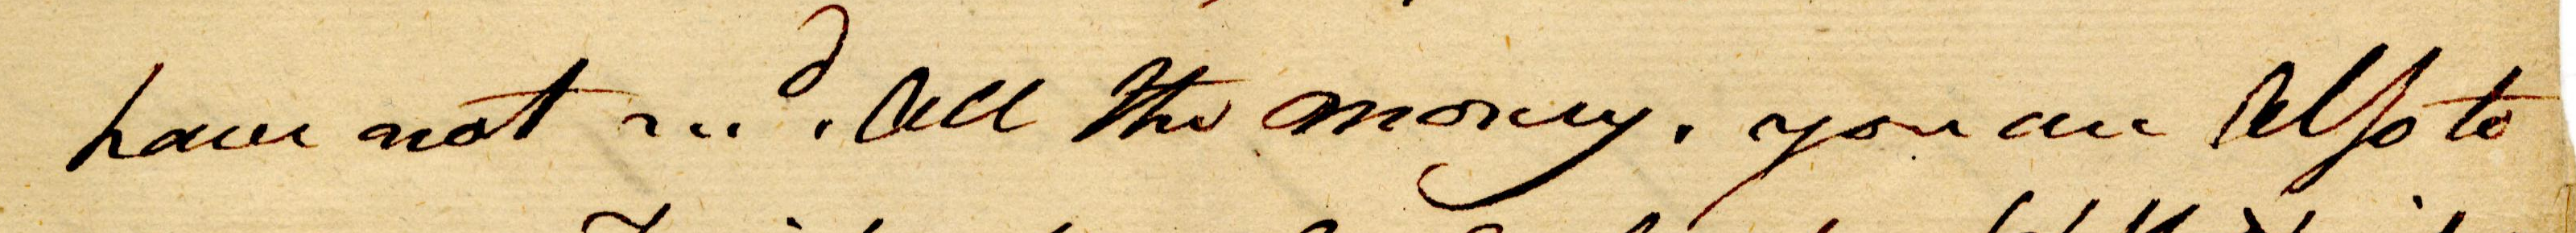have not rec^d. All the money, you are Also to
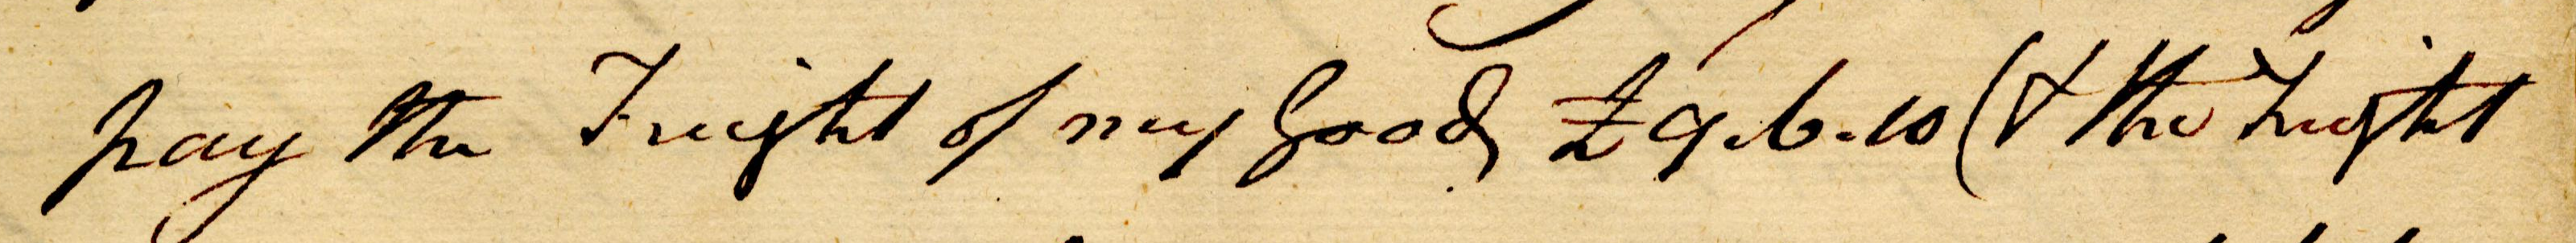pay the Freight of my Goods £96.10 (& the height
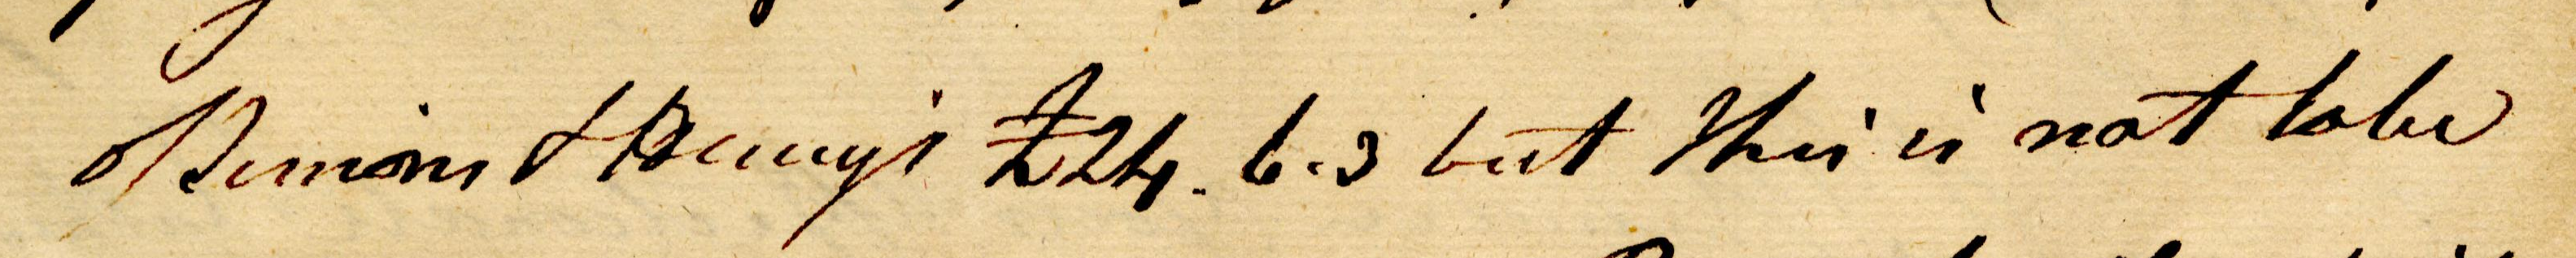of Simons & Dewey's £24.6.3 but this is not to be
